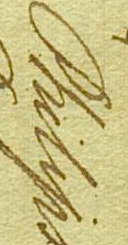Philips
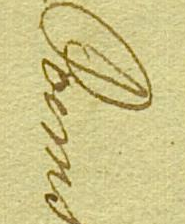Poems
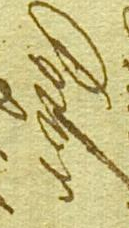Prior
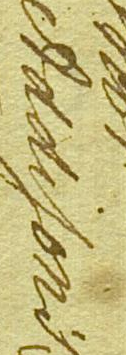Addison's
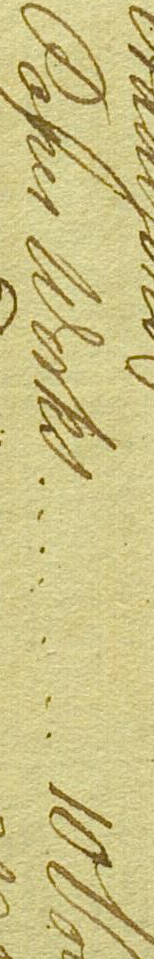Popes Works . . . . . . . . 10 Vols
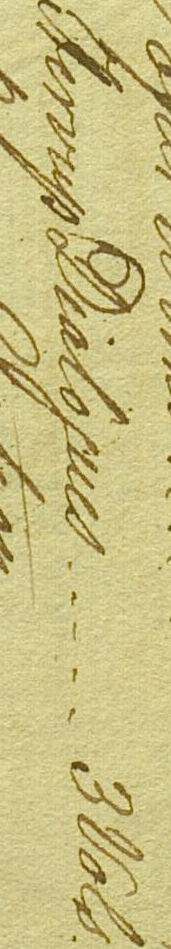Herveys Dialogues . . . . . 3 Vols.
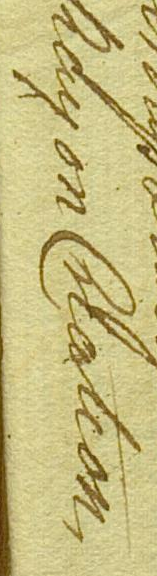Ray on Creation
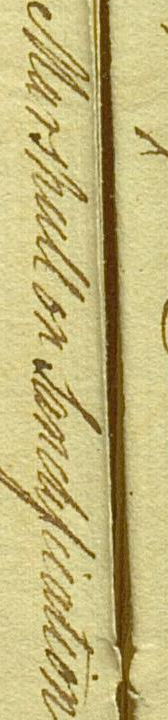Marshall on Sanctification
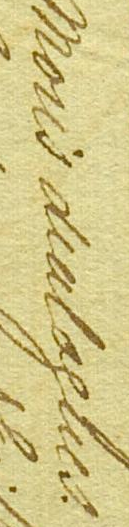More's dialogues.
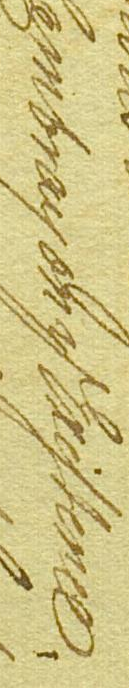Cambray on y^e Existence.
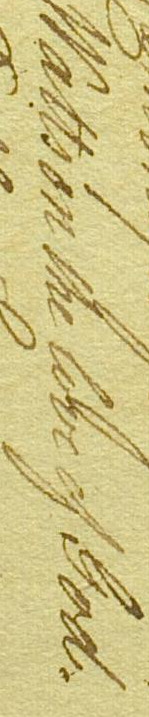Watts on on the love of God.
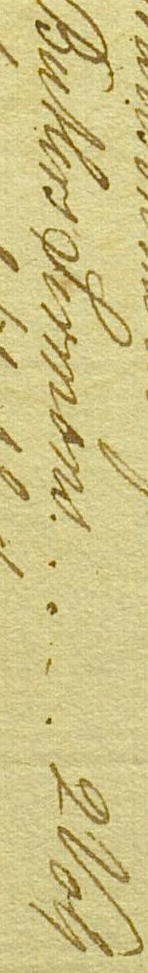Butlers Sermons . . . . . 2 Vols
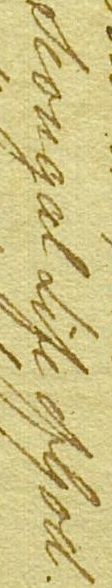Scougal Life of God.
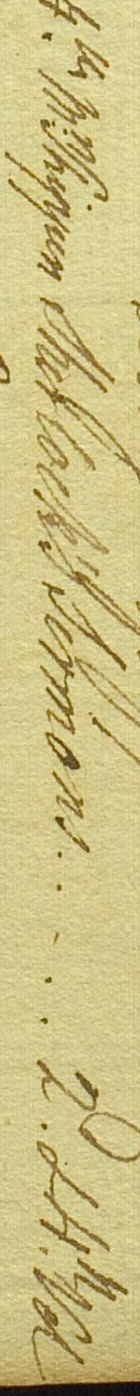4^th. M^r: Shippen Sherlock's Sermons . . . . . 2^d & 4^th Vol
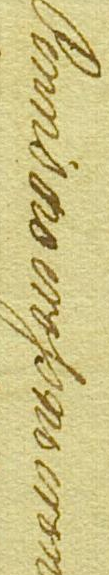Penn's no cross no crown
